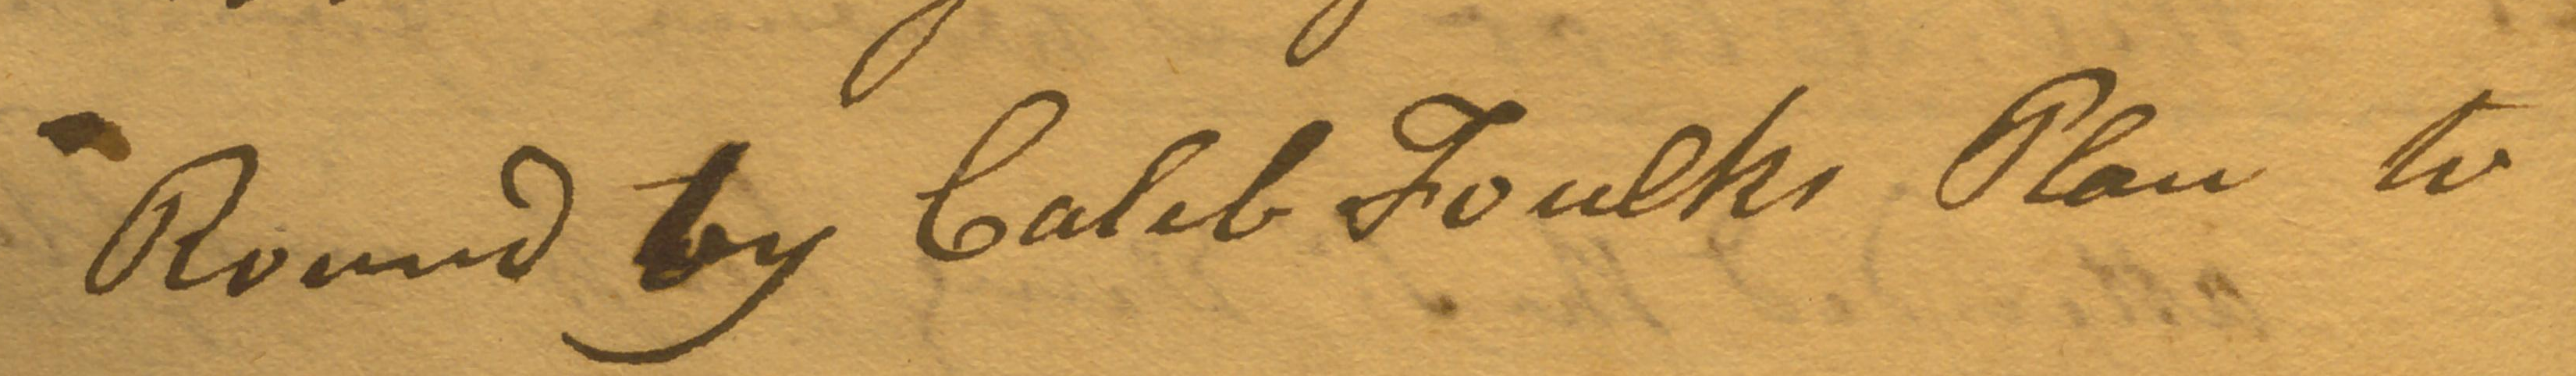Round by Calel Foulks Plan to
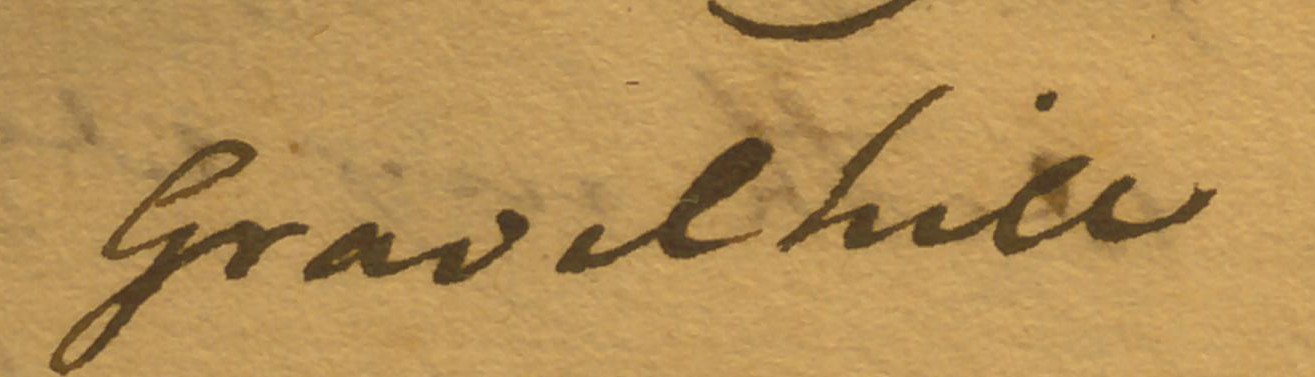Gravelhill
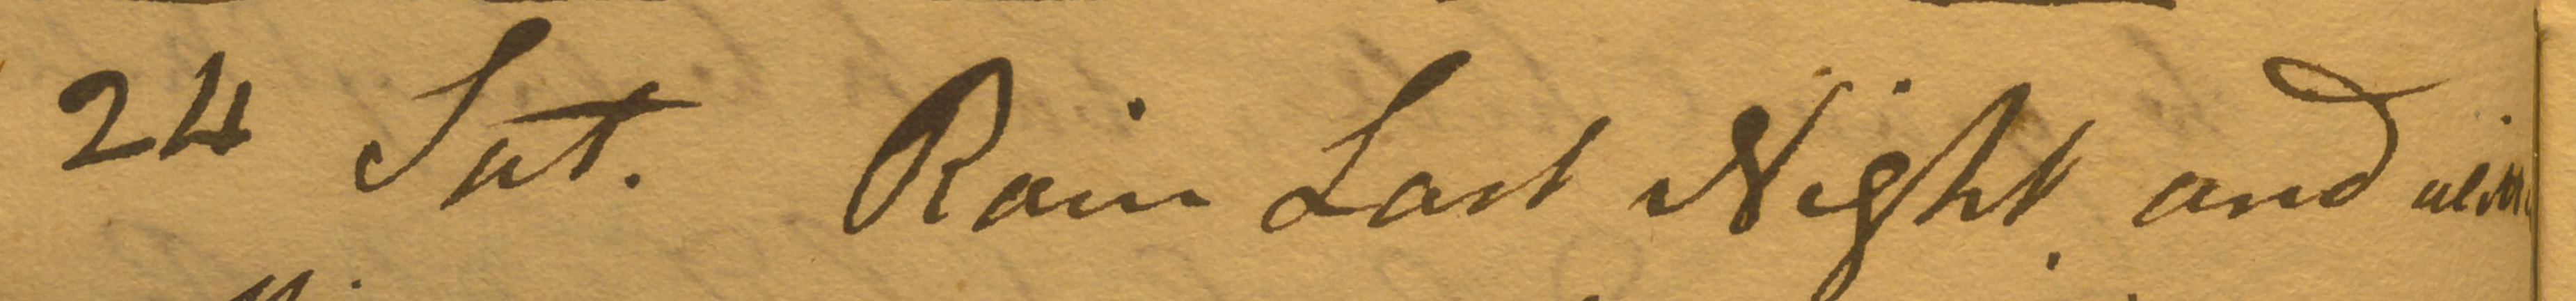24 Sat. Rain Last Night and a little
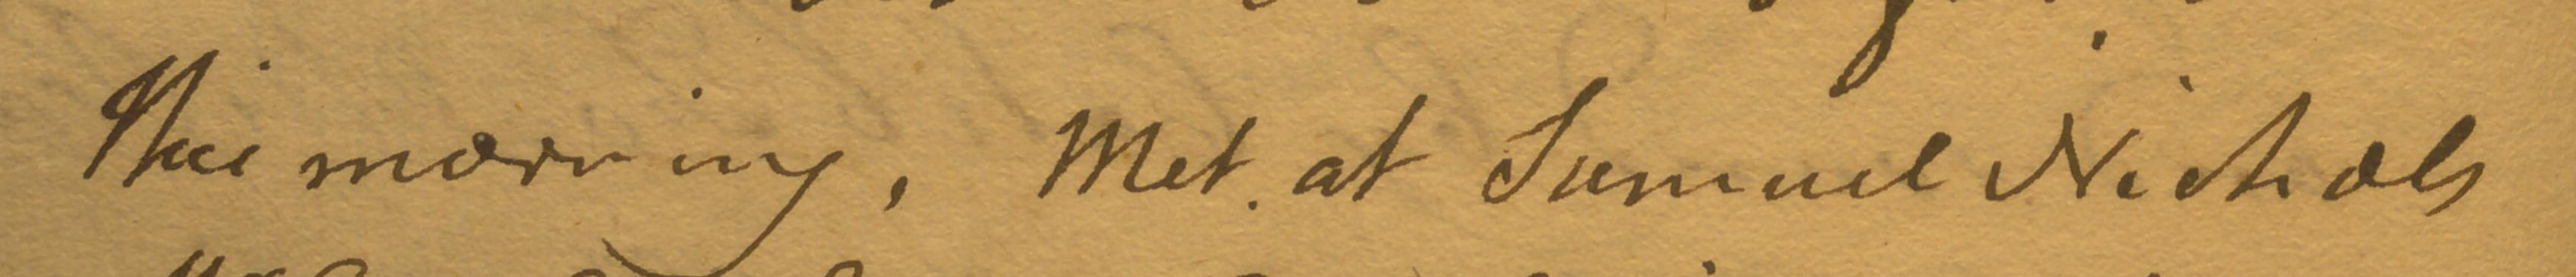this morning, Met at Samuel Nichols
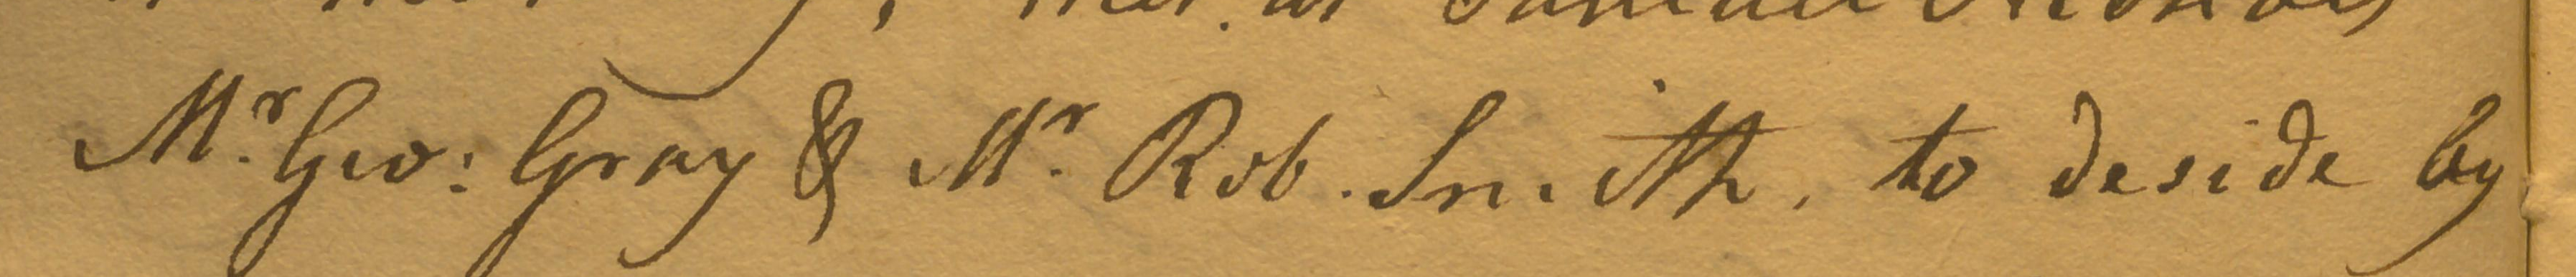M^r. Geo: Gray & M^r. Rob. Smith, to deside by
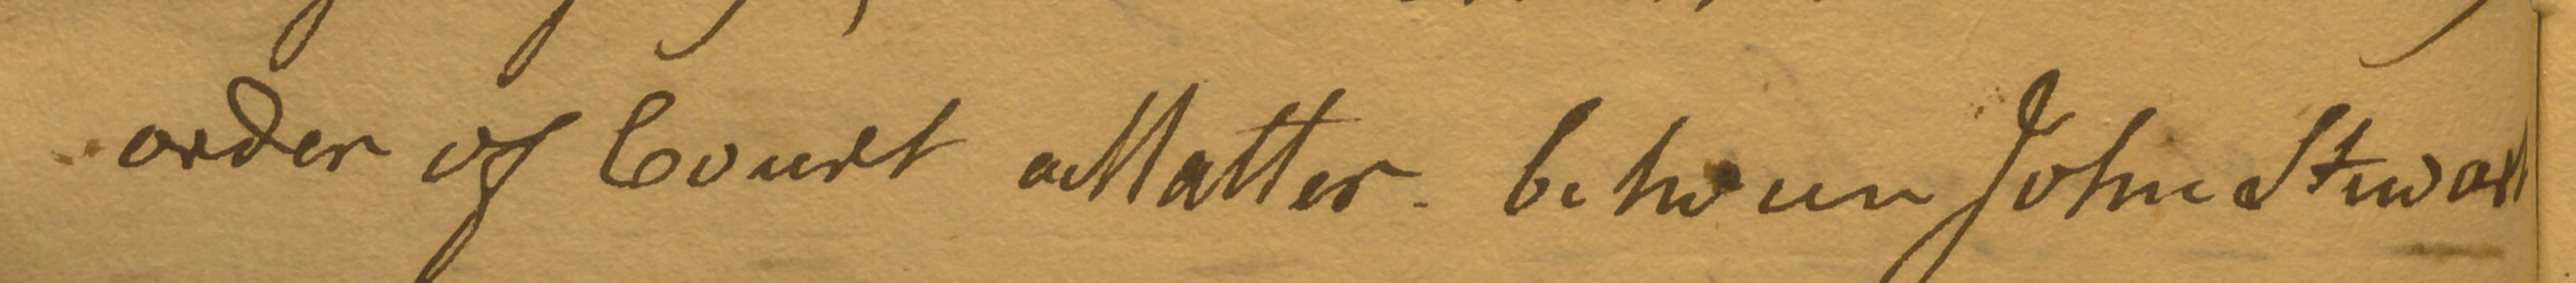order of Court a Matter between John Stewart
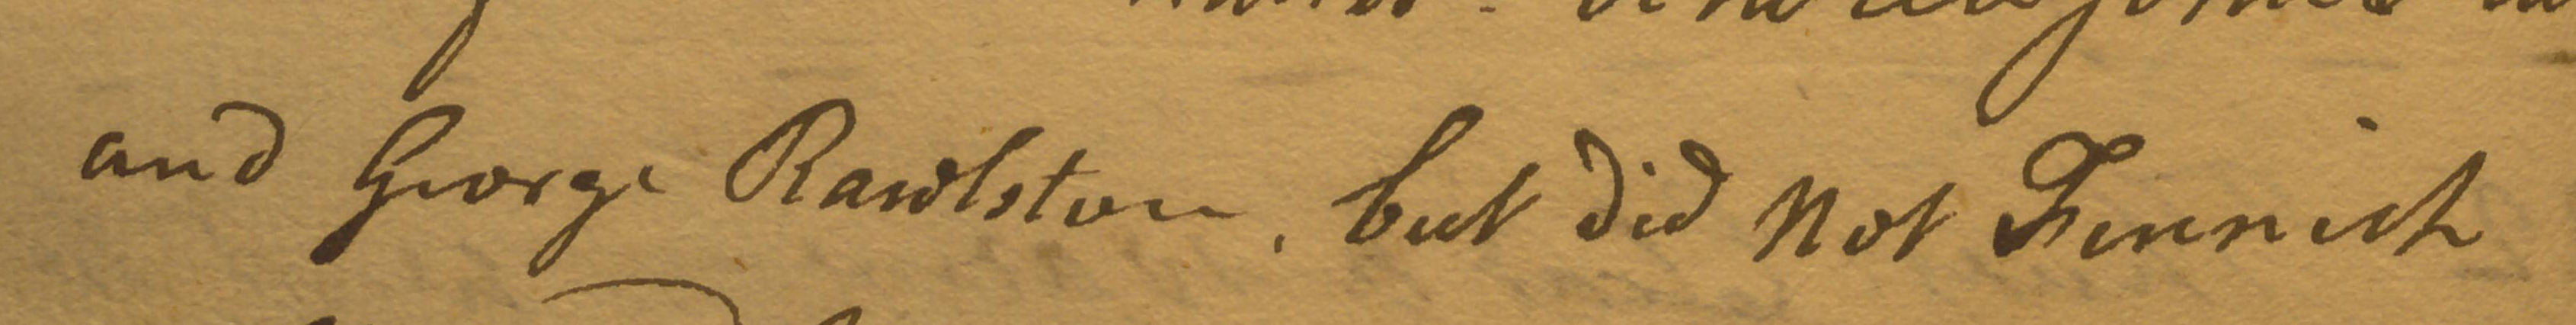and George Rawlston, but did Not Finnish
